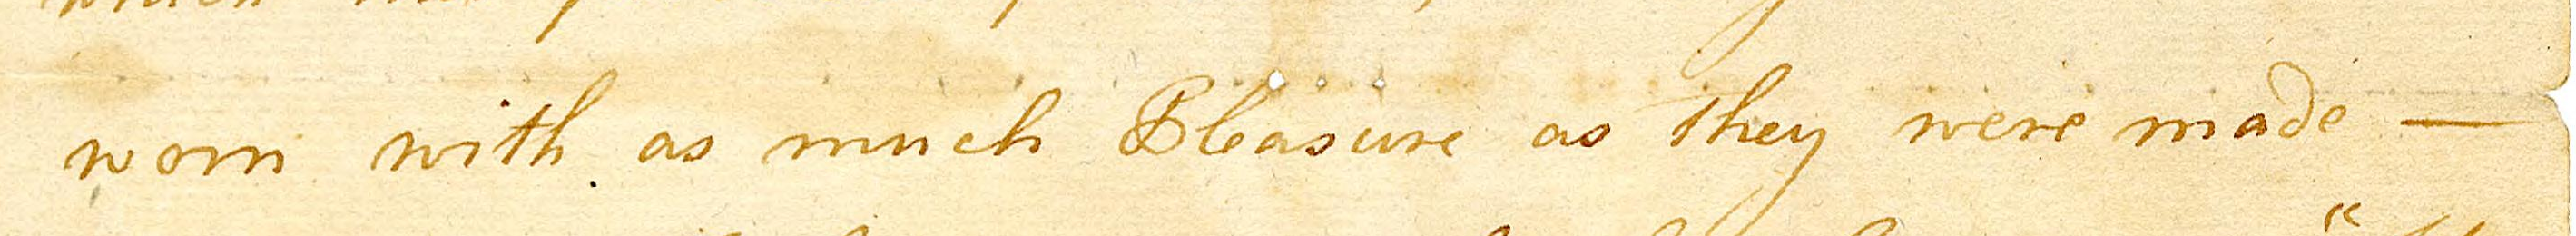worn with as much Pleasure as they were made-
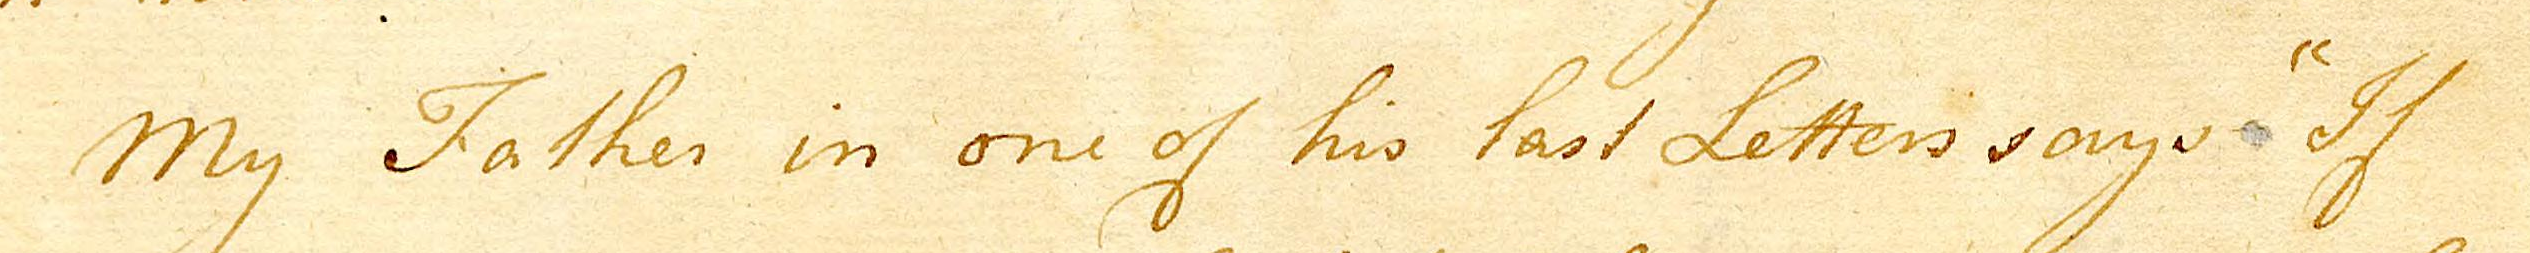My Father in one of his last Letters says "If
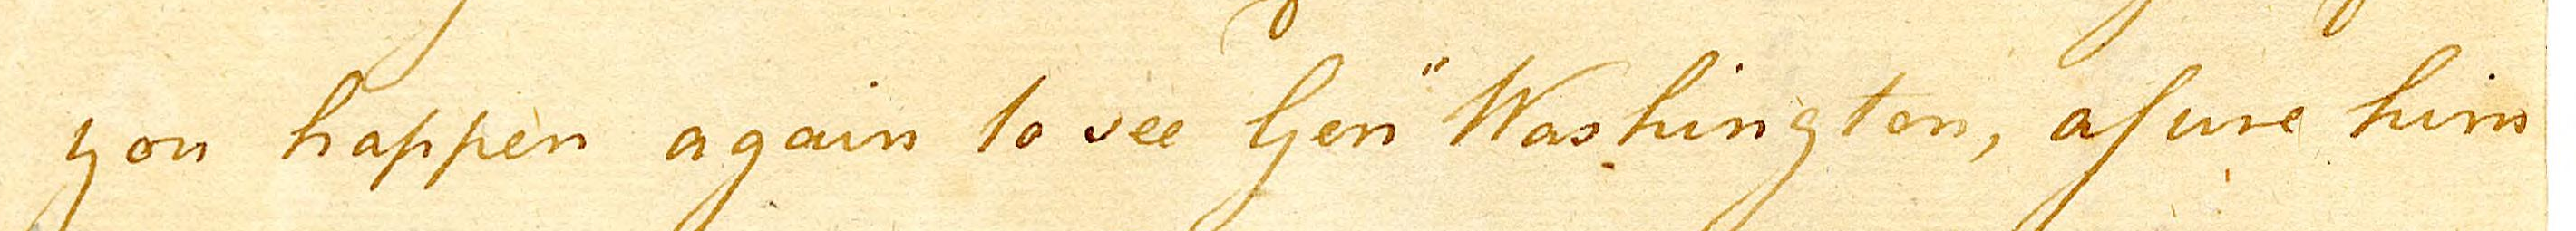you happen again to see Gen^l Washington, assure him
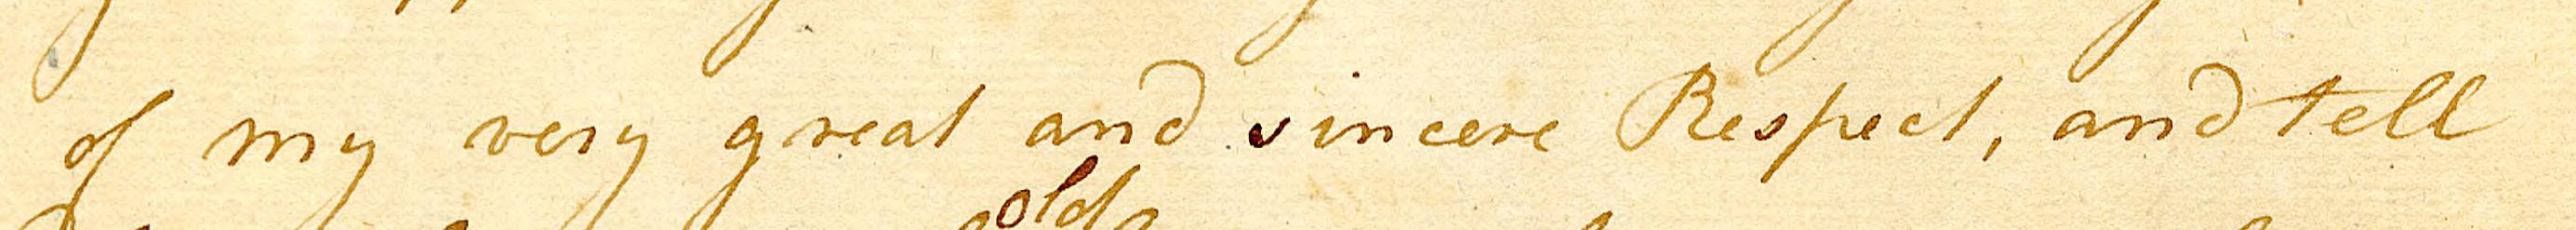of my very great and sincere Respect, and tell
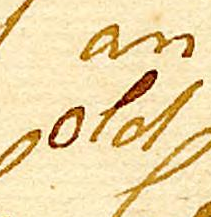old
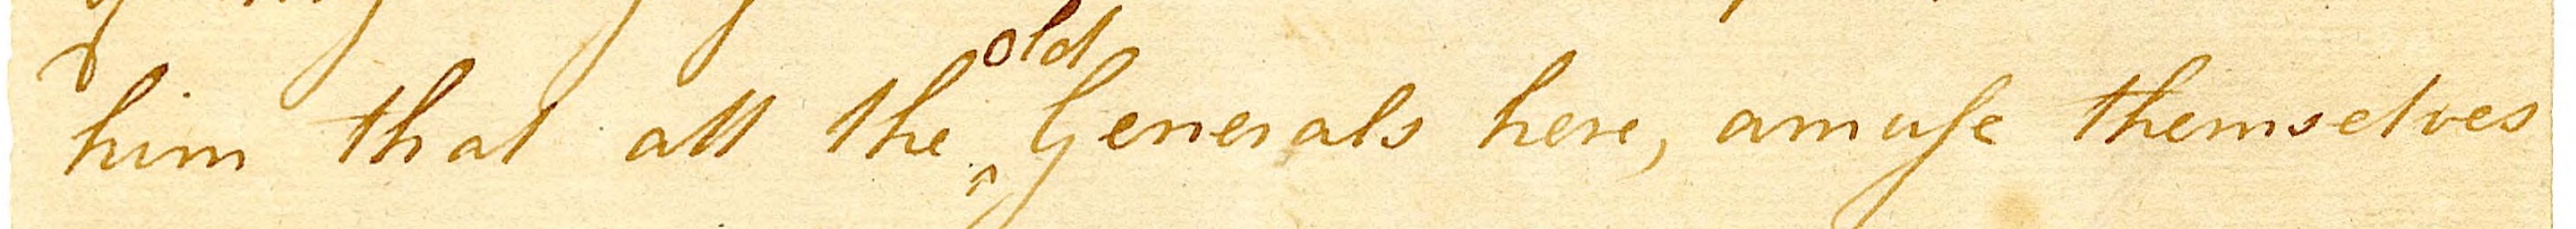him that all the ^ Generals here, amuse themselves
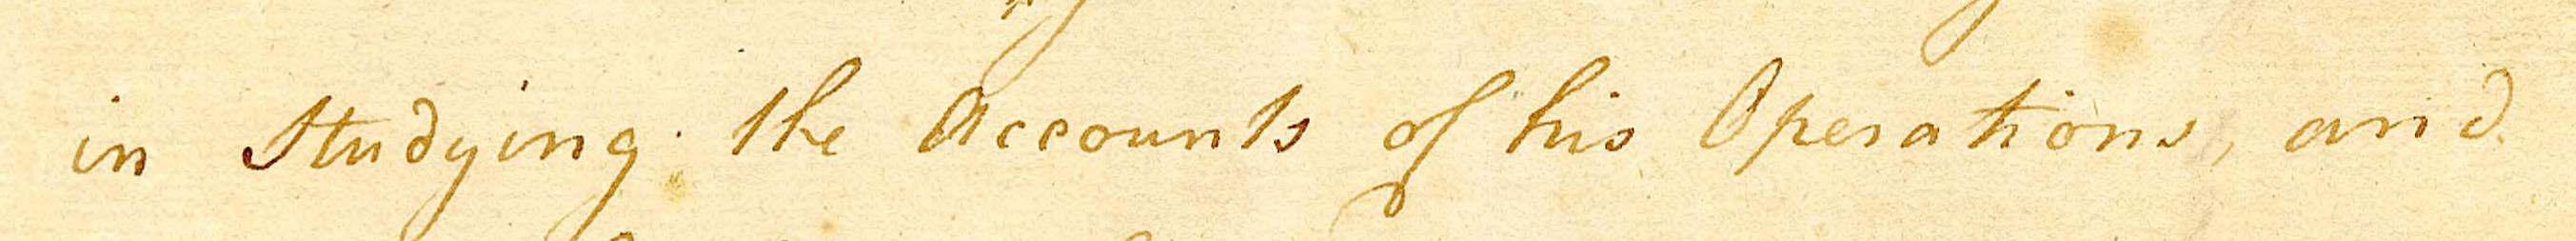in Studying the Accounts of his Operations, and
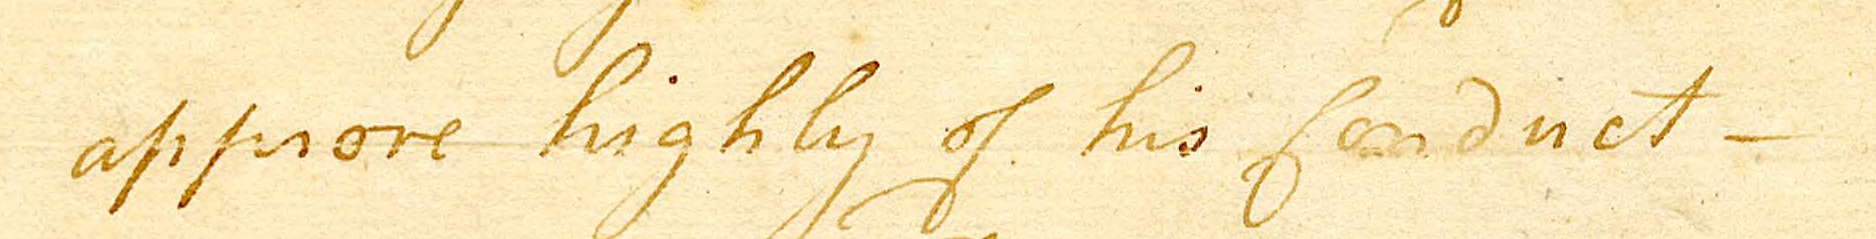approve highly of his Conduct-
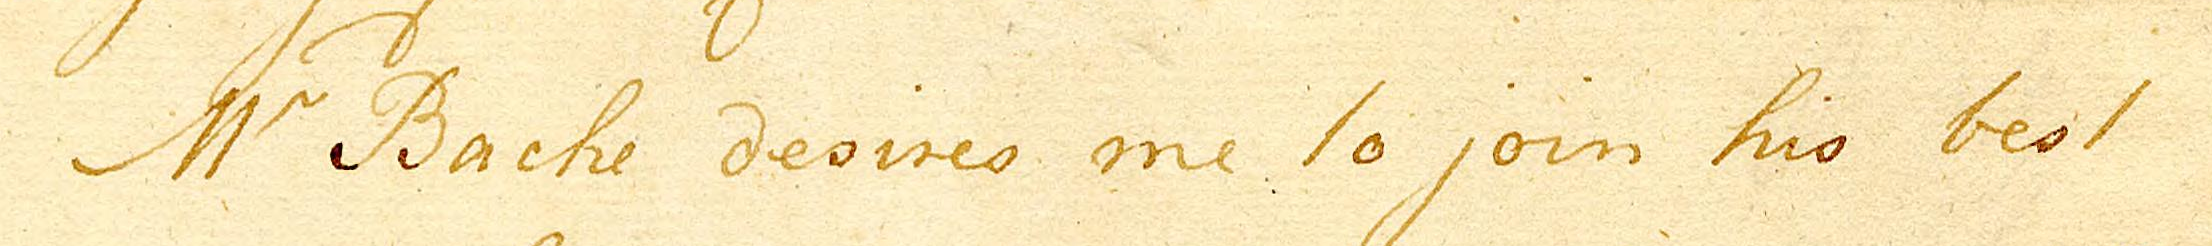M^r Bache desires me to join his best
